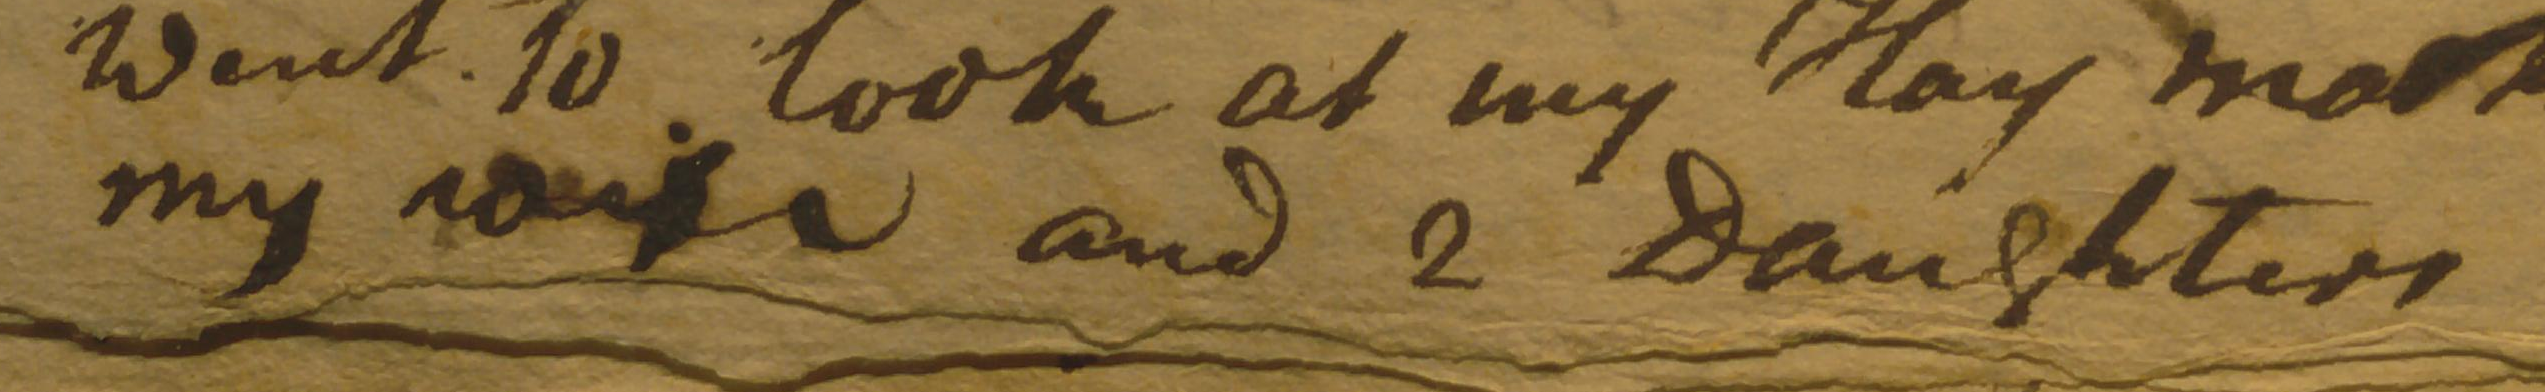my wife and 2 Daughters
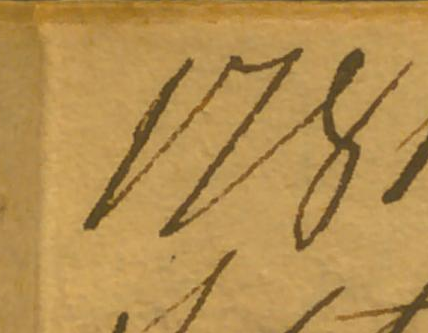1781
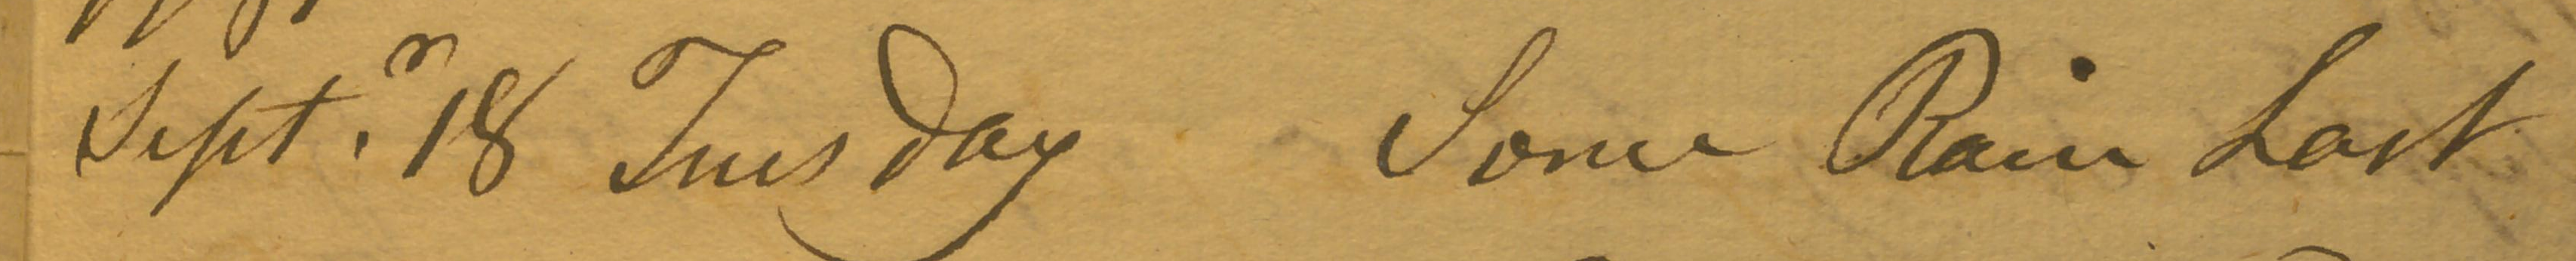Sept^r. 18 Tuesday some Rain Last
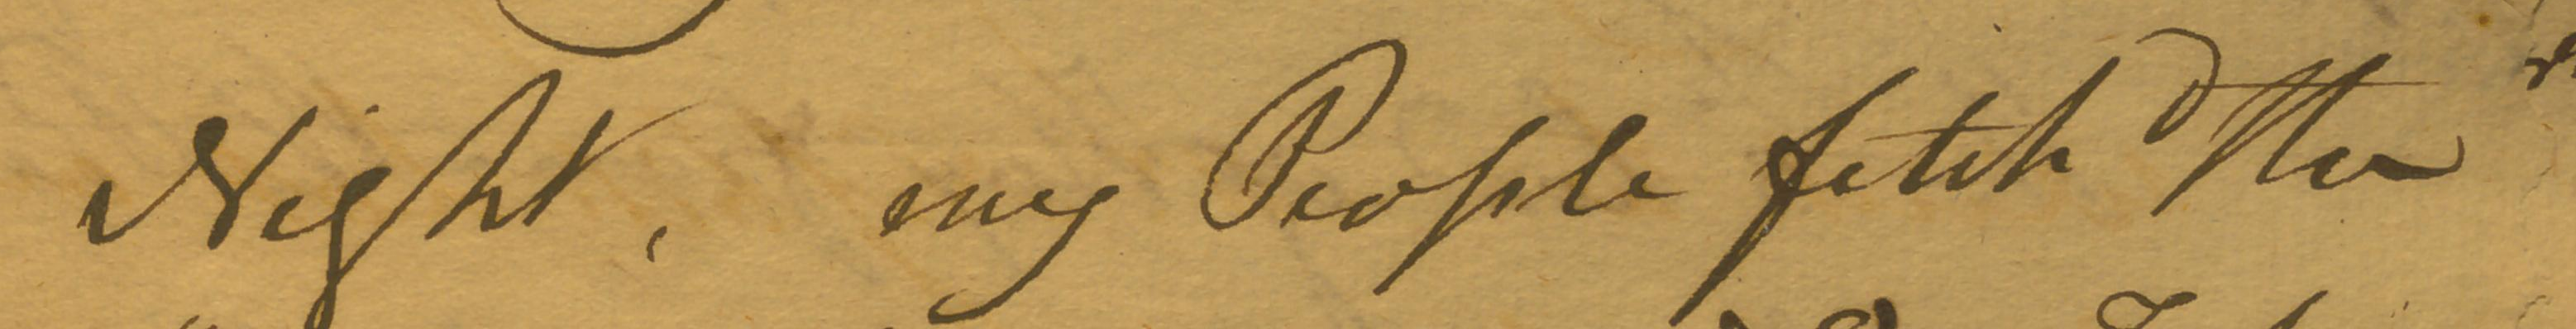Night, my People fetch^d the
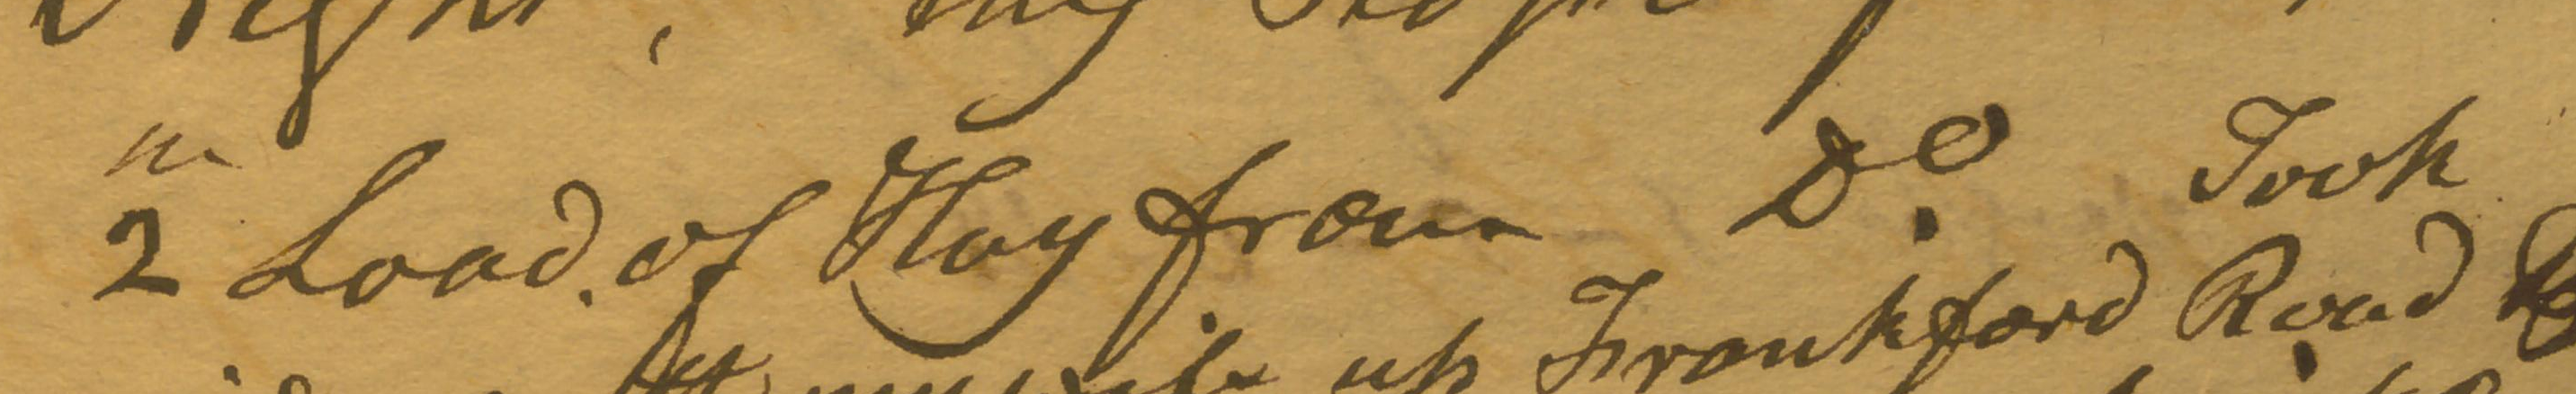2^th Load of Hay from D^o. Took
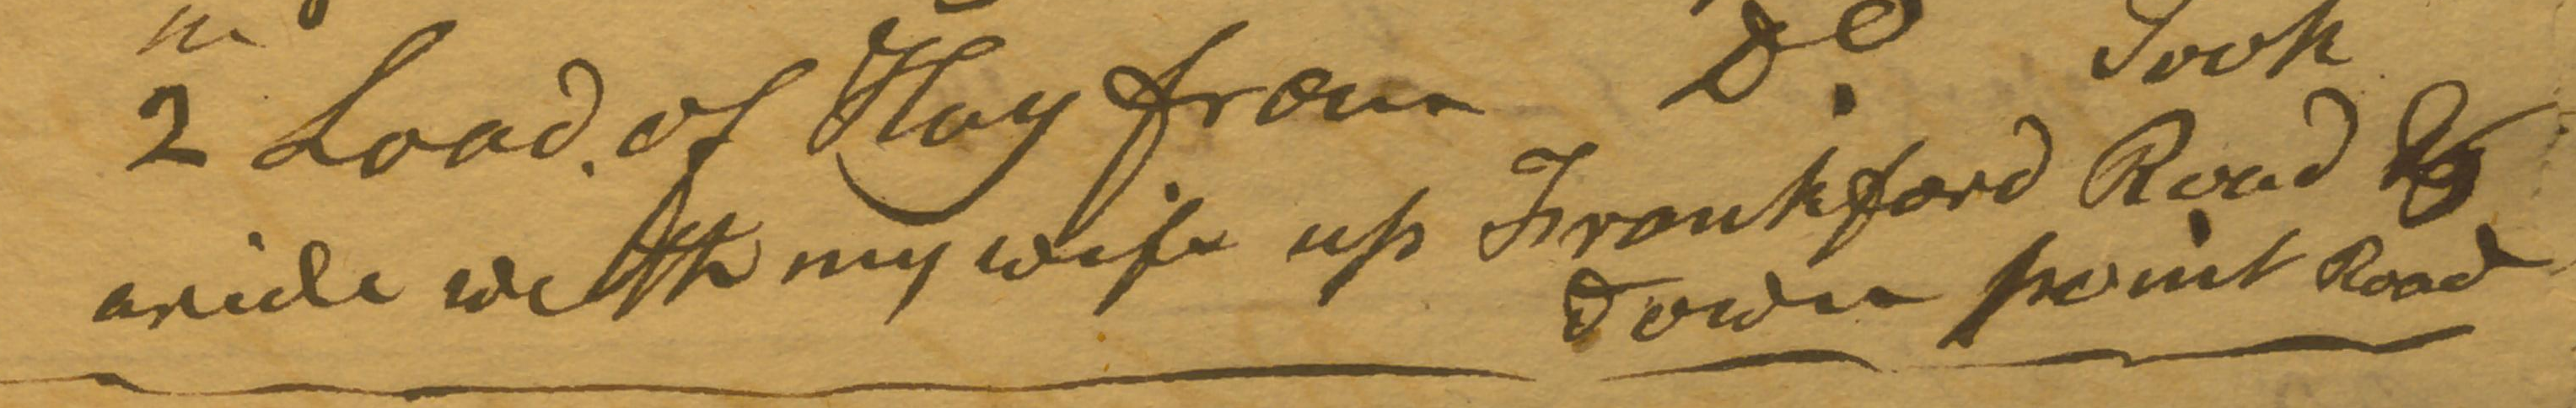a ride with my wife up Frankford Road &
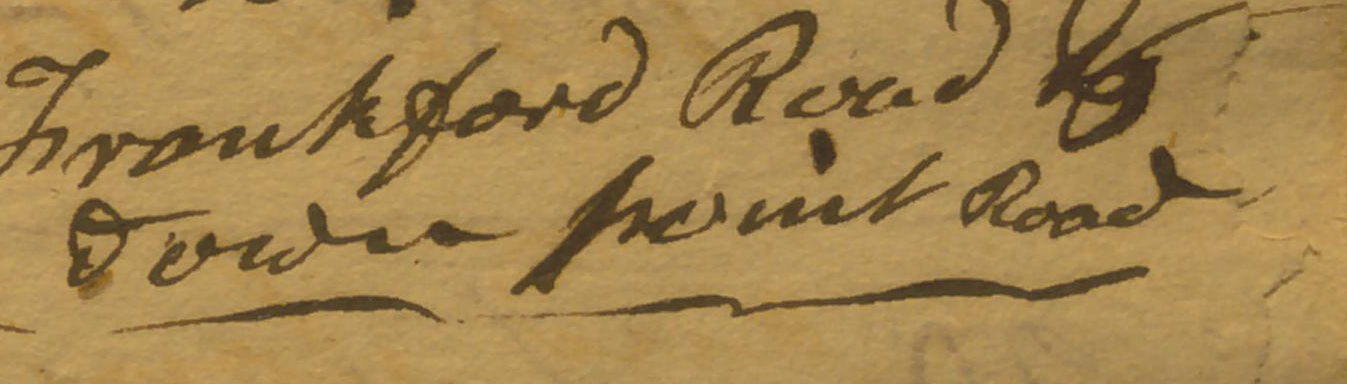down point Road
